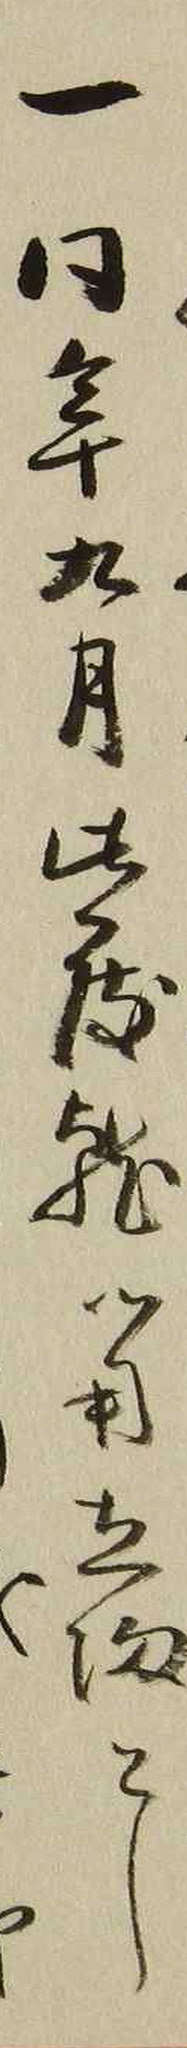一同年九月此度就御用立帰とし
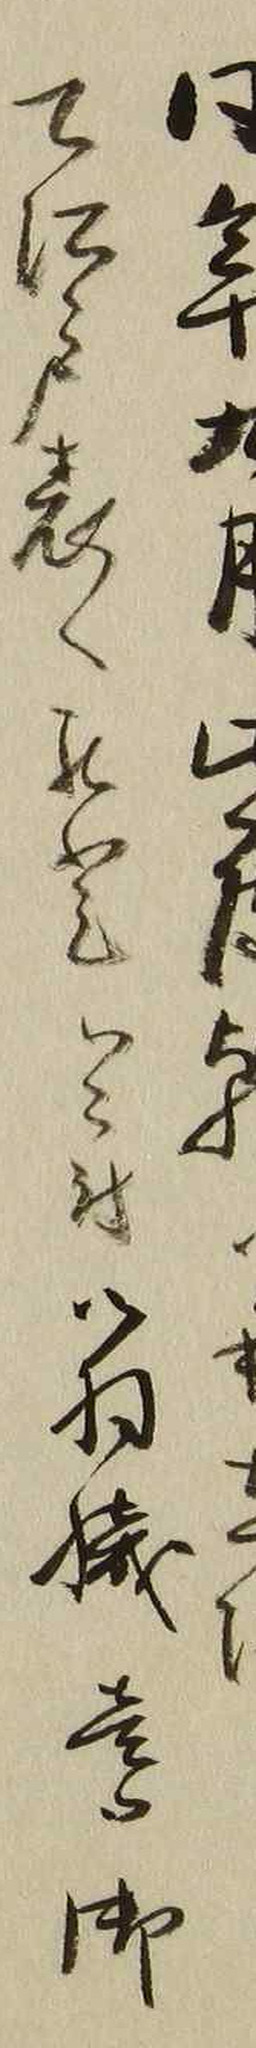て江戸表へ罷登候に付御羽織壱つ御
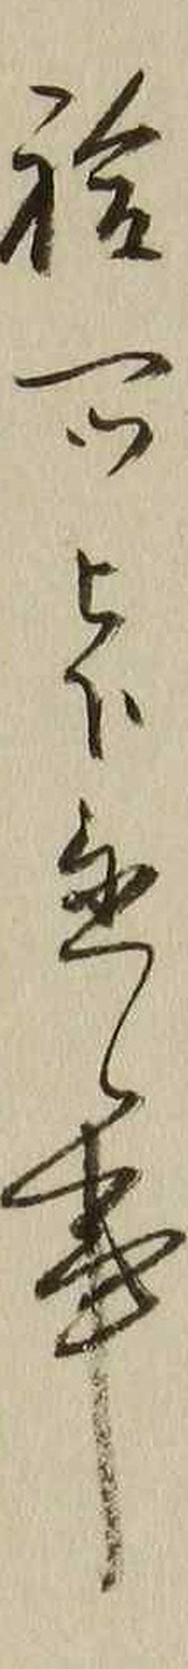袷一つ被下置候事
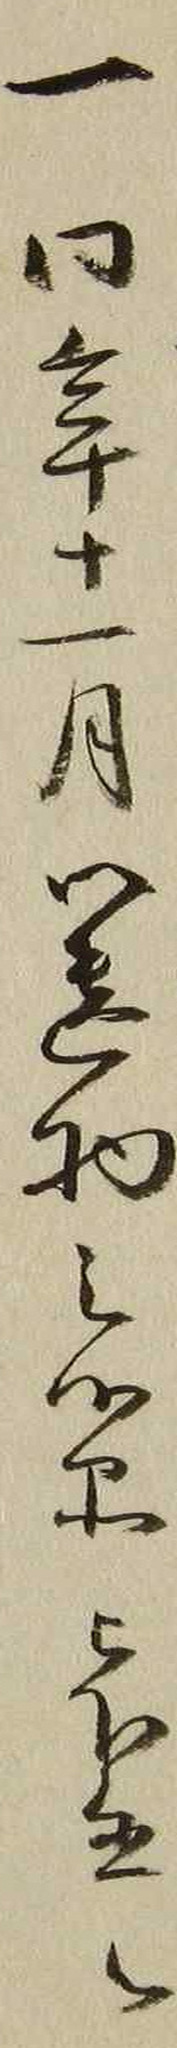一同年十一月御進物之御品被下置候
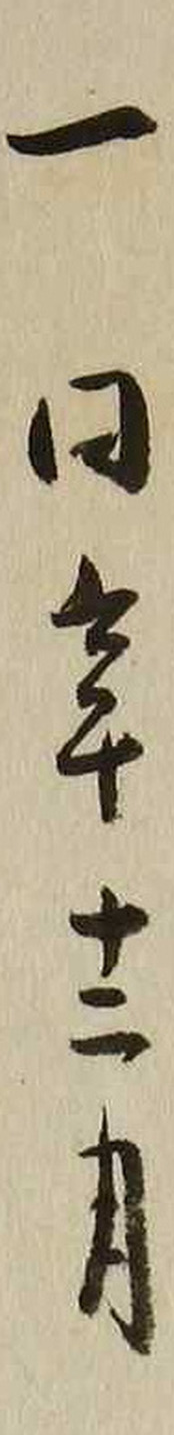一同年十二月
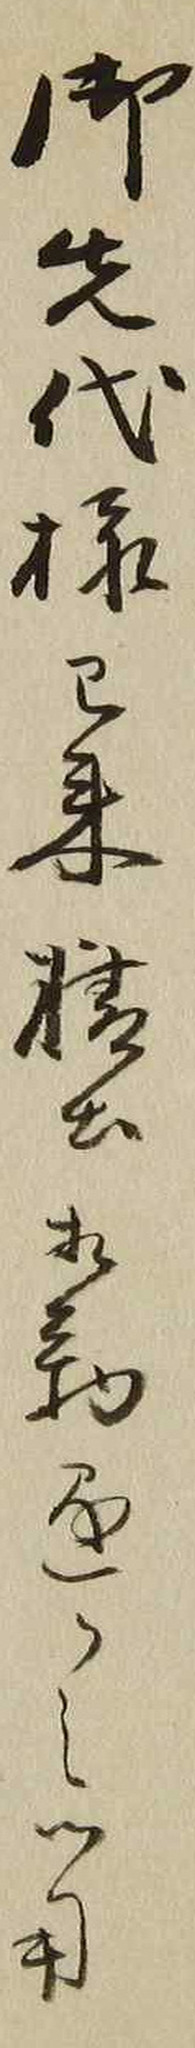御先代様已来精出相勤懸り之御用
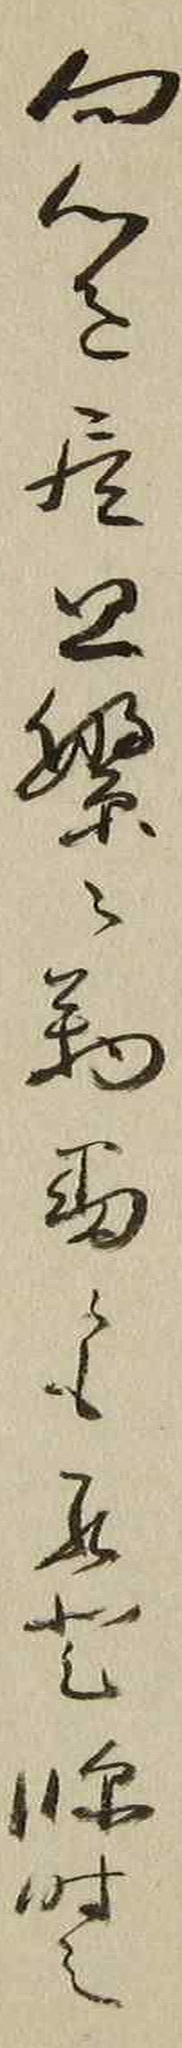句心を尽且繋々勤番にも罷登臨時之
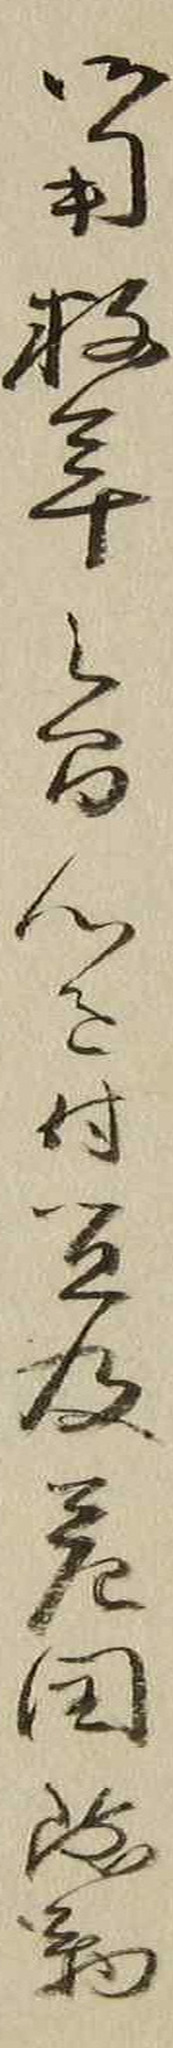御用枚年之間心を付宜及指図致勤
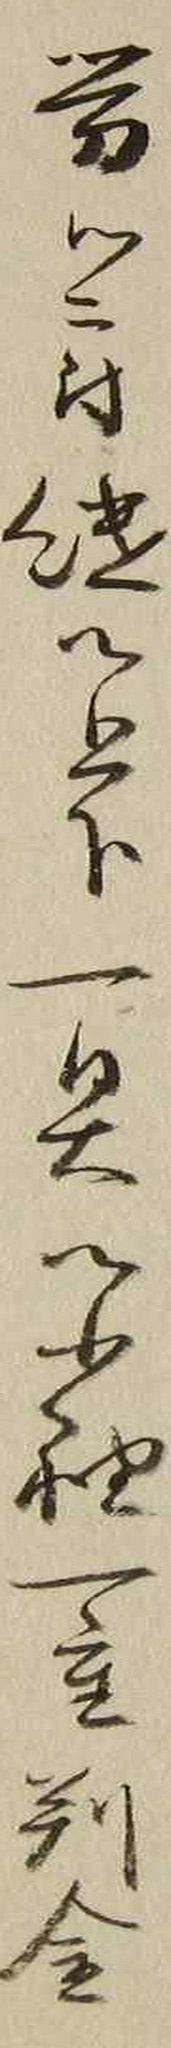労候に付継御上下一具御小袖一重判金
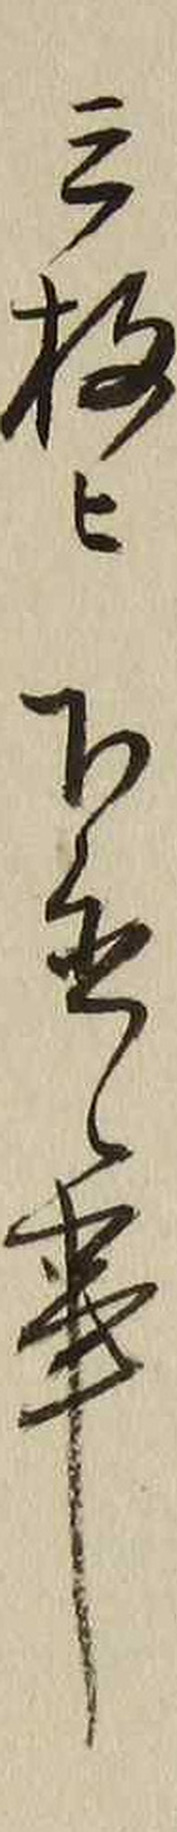壱枚被下置候事
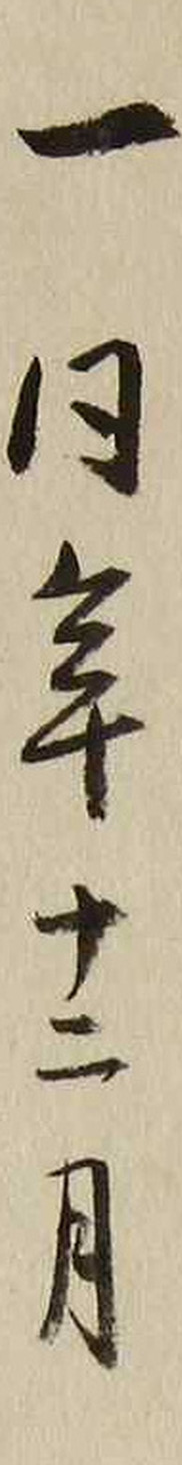一同年十二月
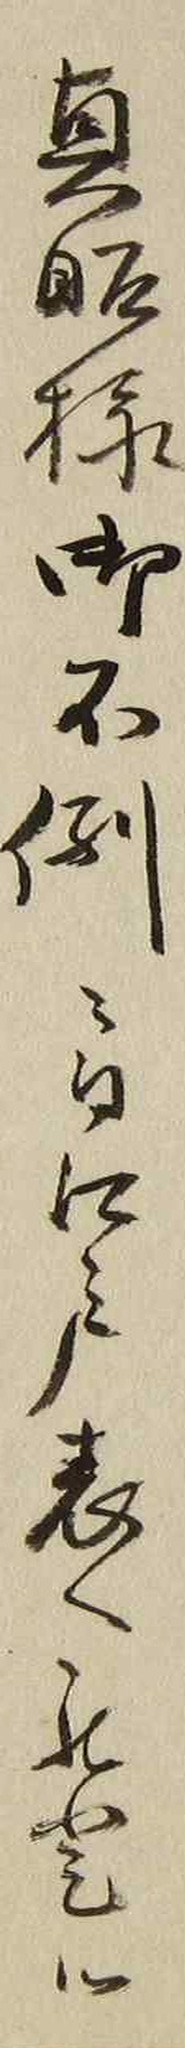貞昭様御不例に付江戸表へ罷登候
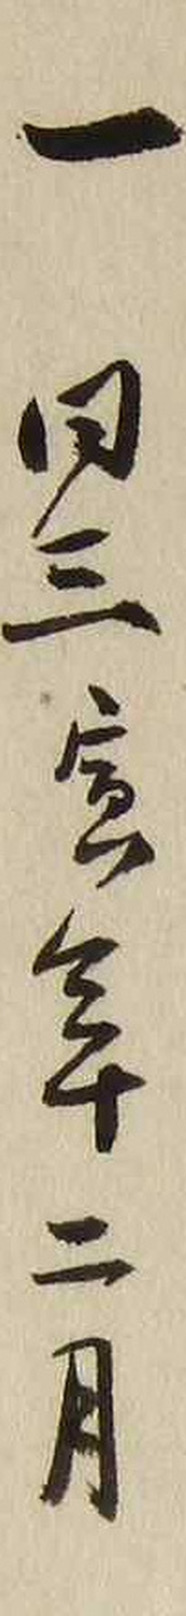一々三寅年二月
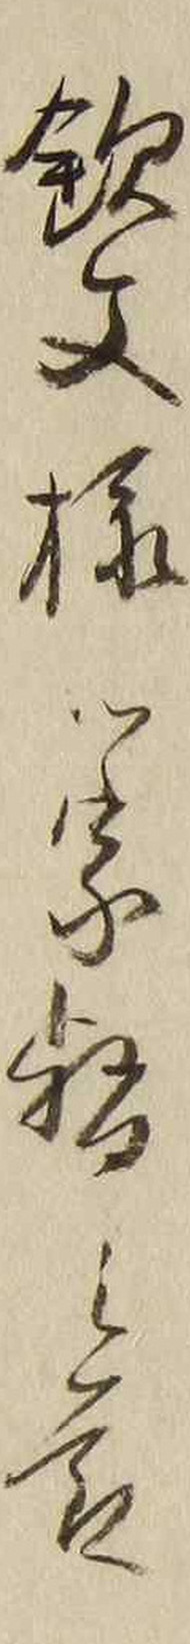欽文様御家督之節

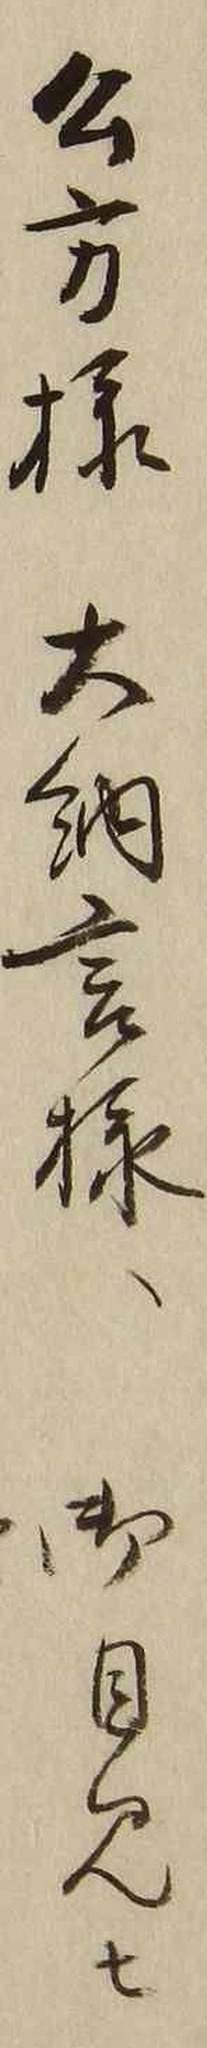公方様大納言様へ御目見被
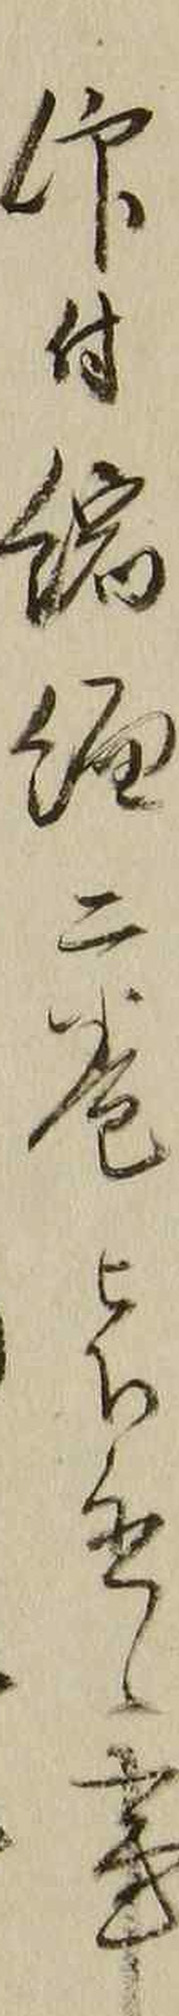仰付縮緬二巻被下置候事
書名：諸士系譜　巻之292　き之部1
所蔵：会津若松市立会津図書館
